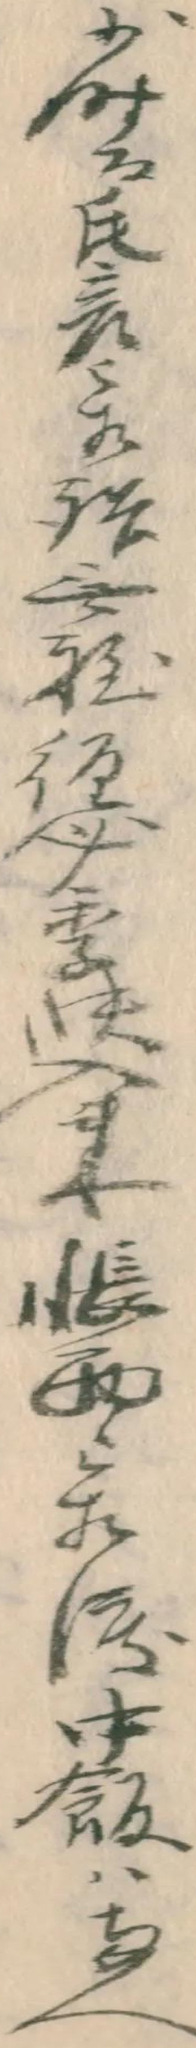少時而氏彦被相詰無程経必季快入来帳面被相渡中飯ハ両人
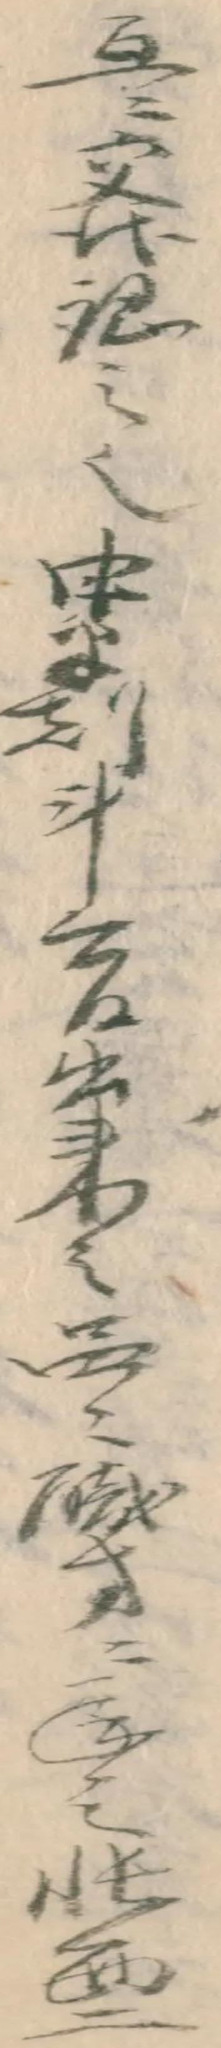互ニ交代認之也申半刻斗今日出来之品々職方ニ承之帳面二
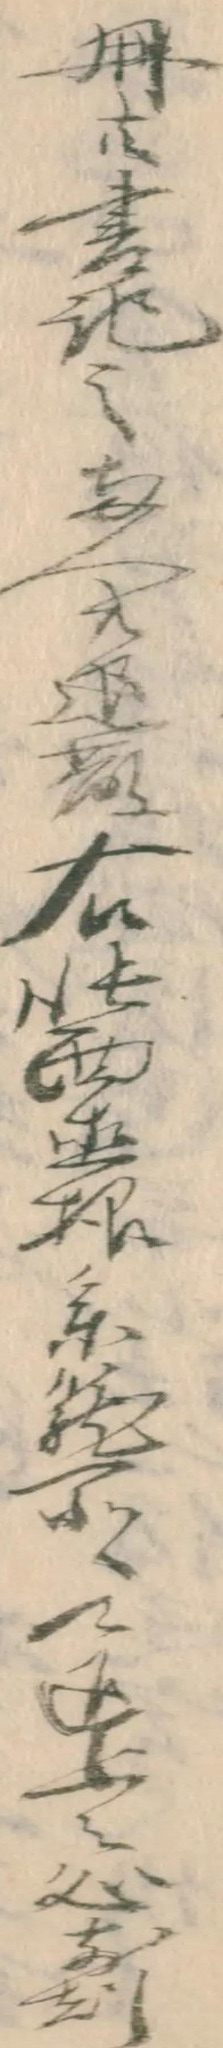冊共書記之両人共退散右帳面直様参籠所へ可返上之処前刻
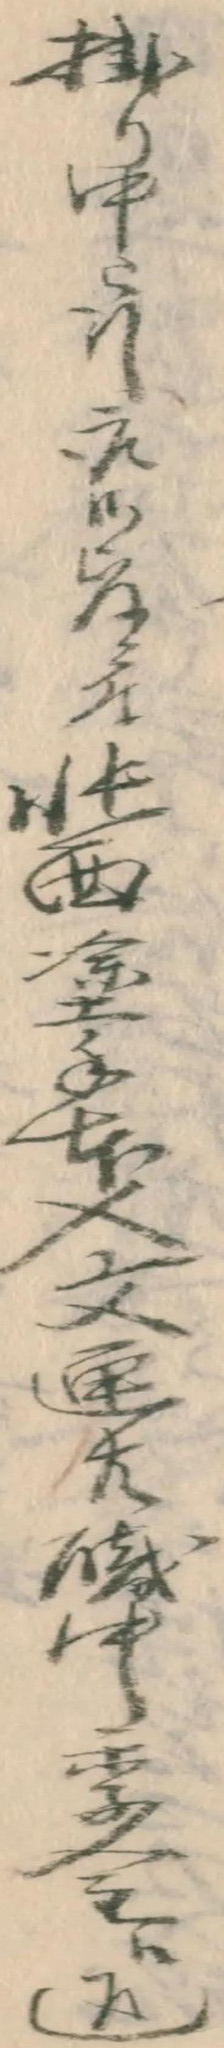掛り中え引取候旨ニ付帳面塗手本入文匣共職中季金え返
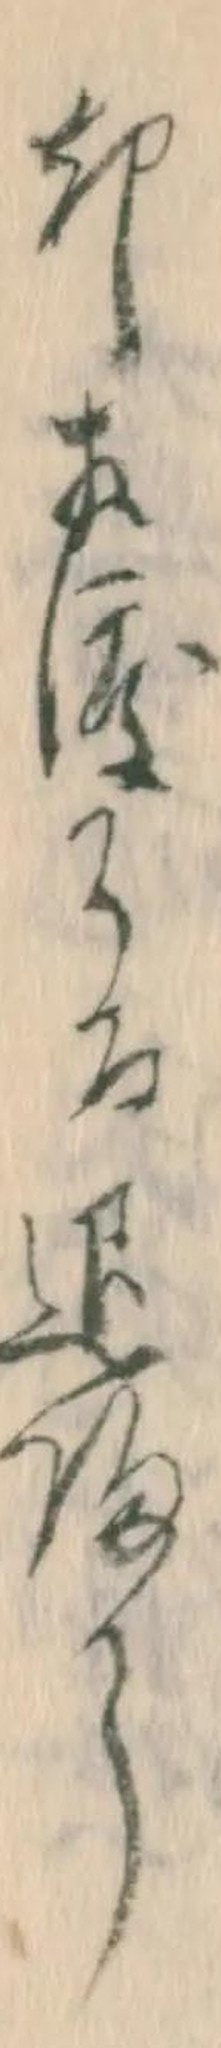却而相渡了而退帰了
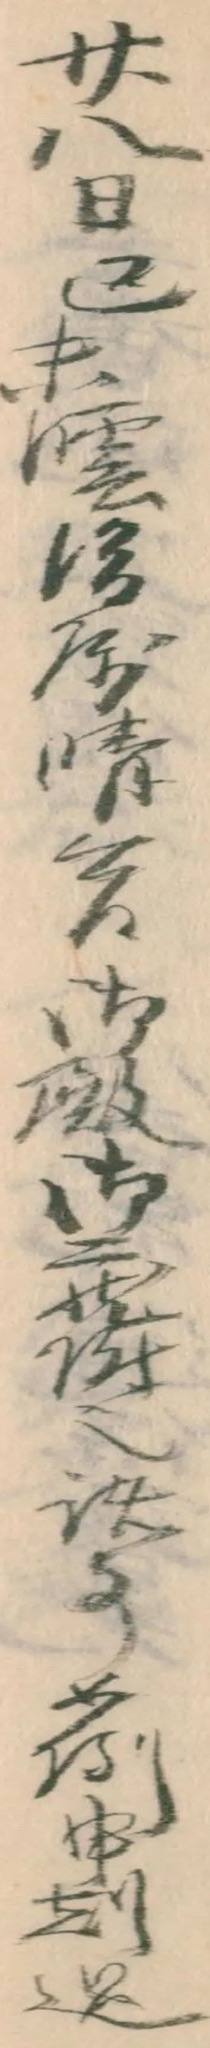廿八日己未曇後属晴今日御殿御蔵附之諸事如例申刻過
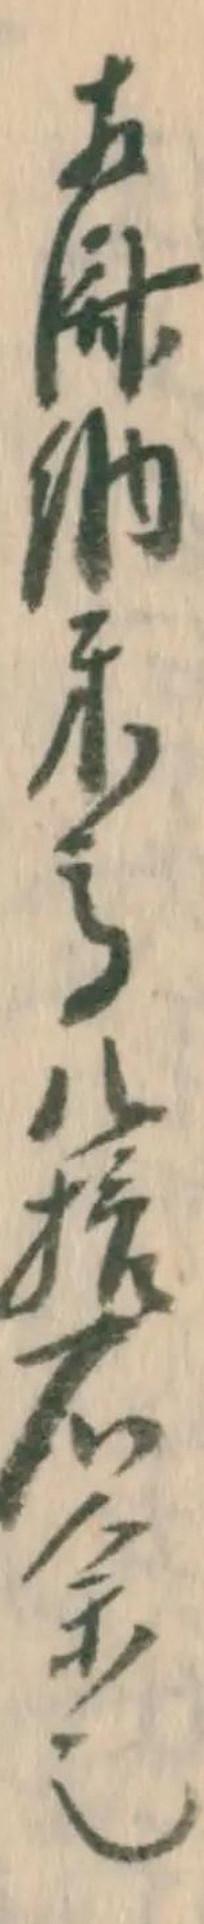相済納米高八拾石余也
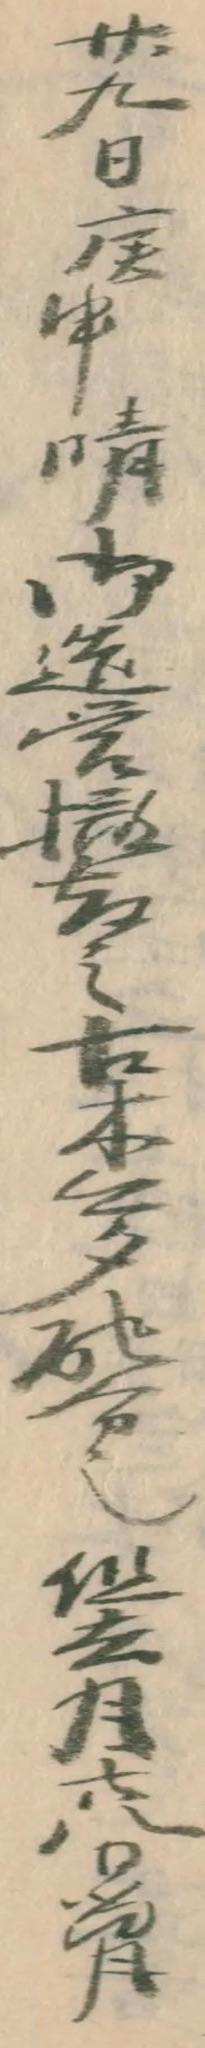廿九日庚申晴御造営撤却之古木今夕配分也但去月廿八日當月
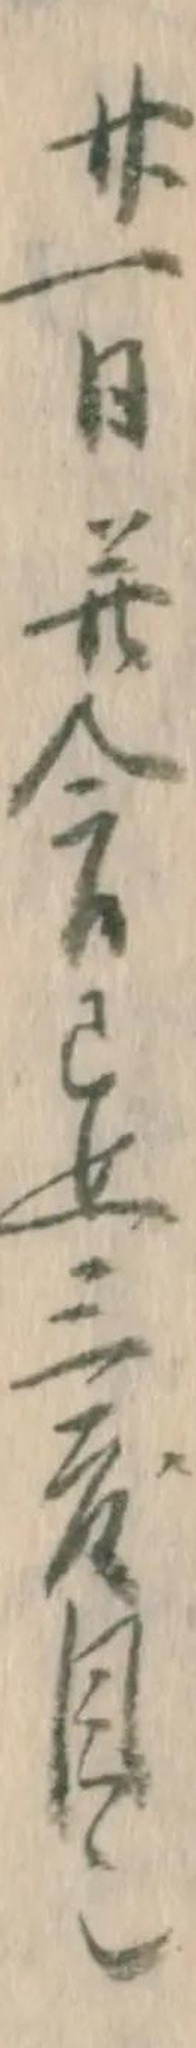廿一日幷舎已上三度目也
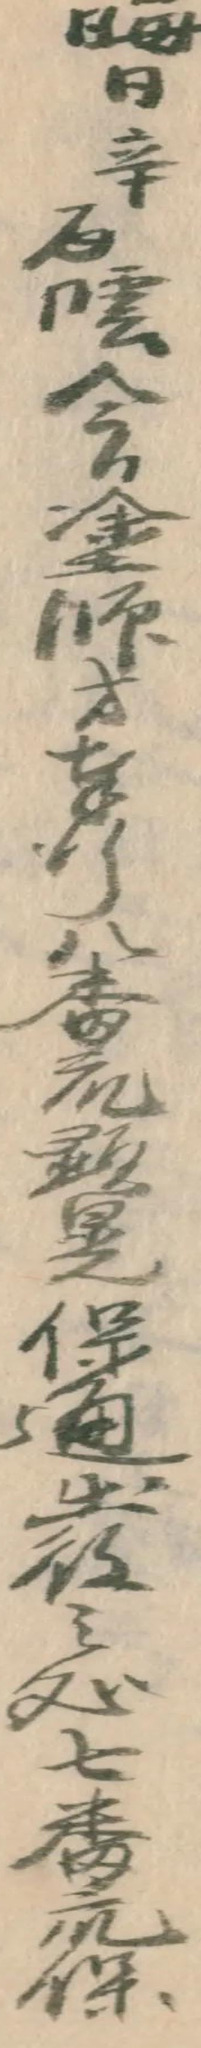晦日辛酉曇今日塗師方奉行八番衆顕晃保通出役之処七番衆保
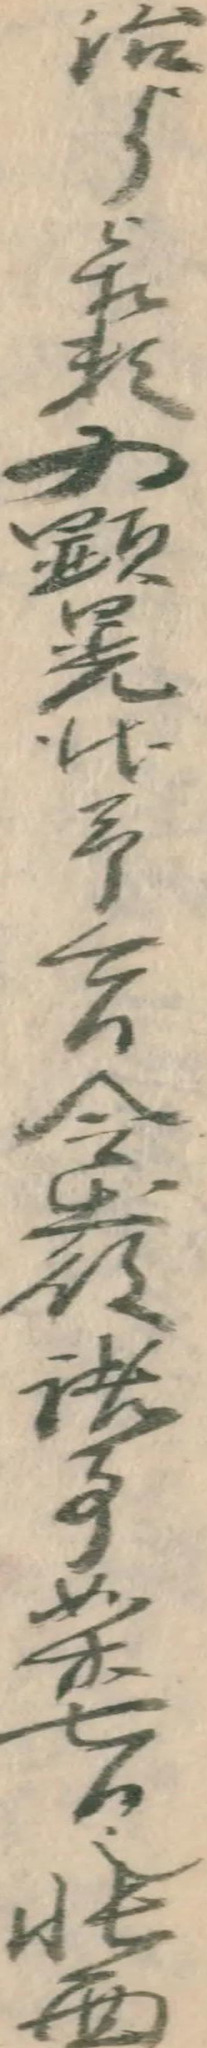治より被相頼為顕晃代予今日令出役諸事如廿七日之帳面
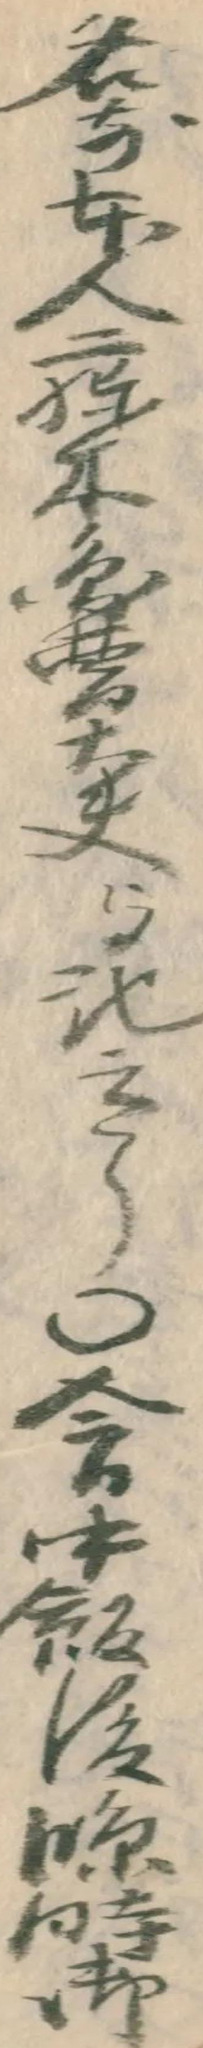名前本人藤木図曹大夫と記之了○今日中飯後臨時御
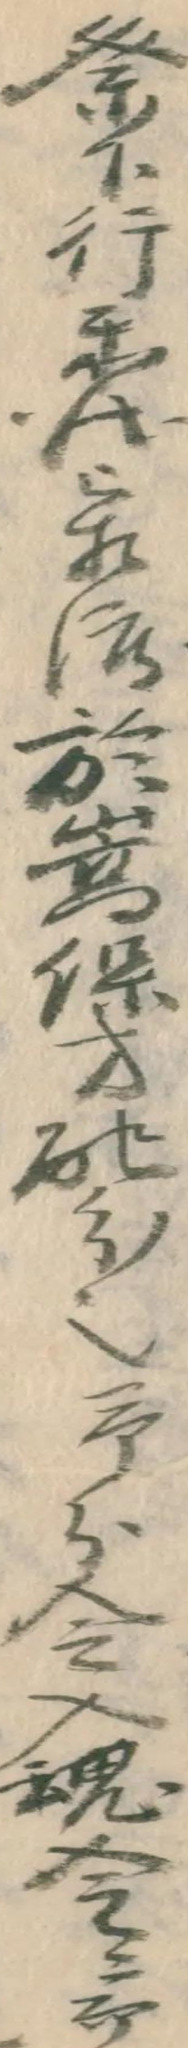祭下行米代被相渡於嵩保方配分也予分令入魂金ニ而
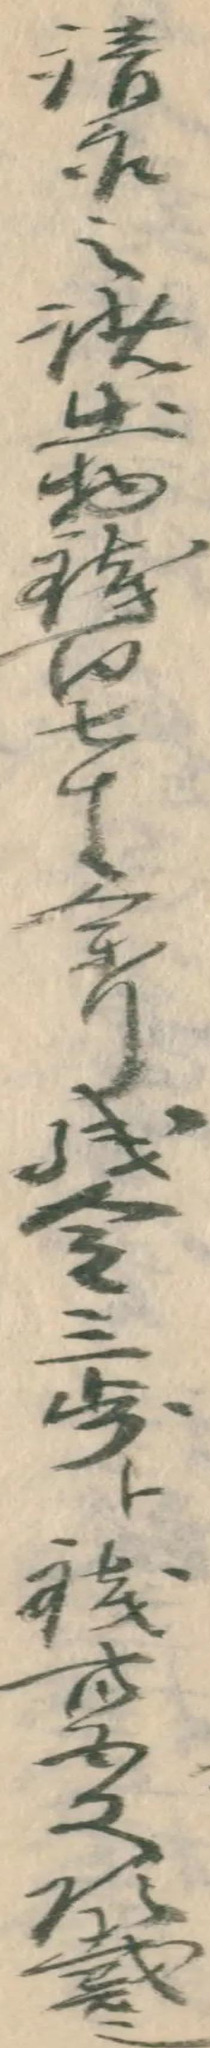請取之諸出物銭百七十余引銭金三歩と銭卅五文頂戴之
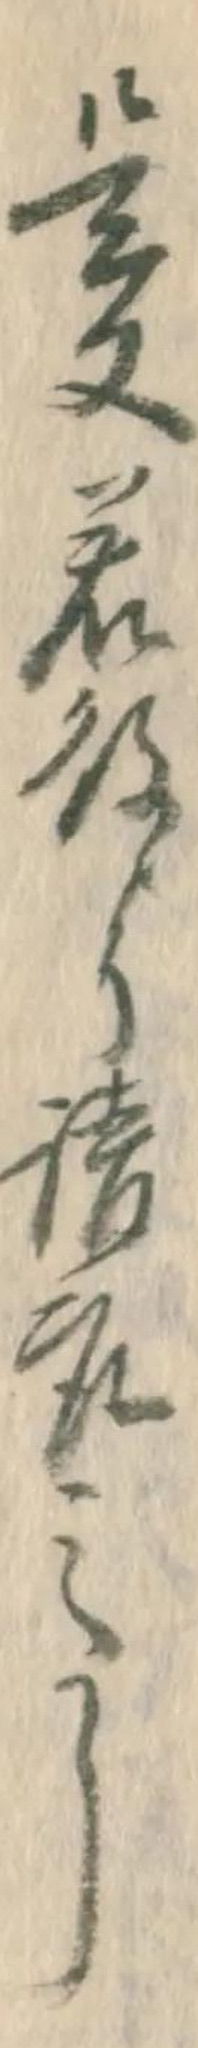是又若役より請取之了
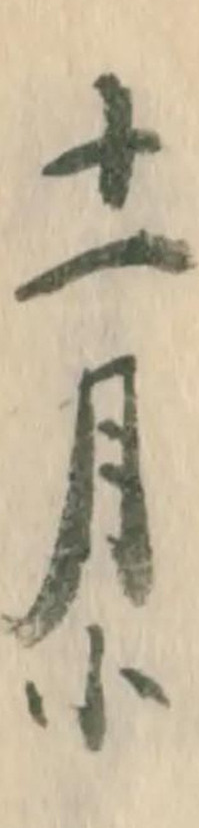十一月小
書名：賀茂社記録. 第66冊
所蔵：国立国会図書館 National Diet Library, JAPAN
